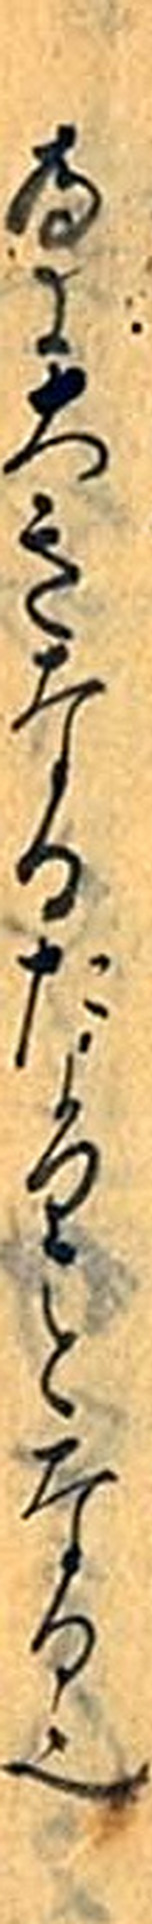為に大きなるたよりとなる也
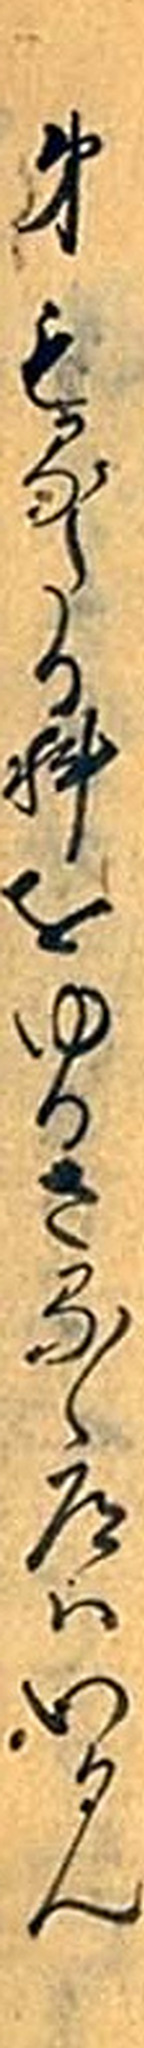弟もるたる科をゆるさるゝ道はいかん
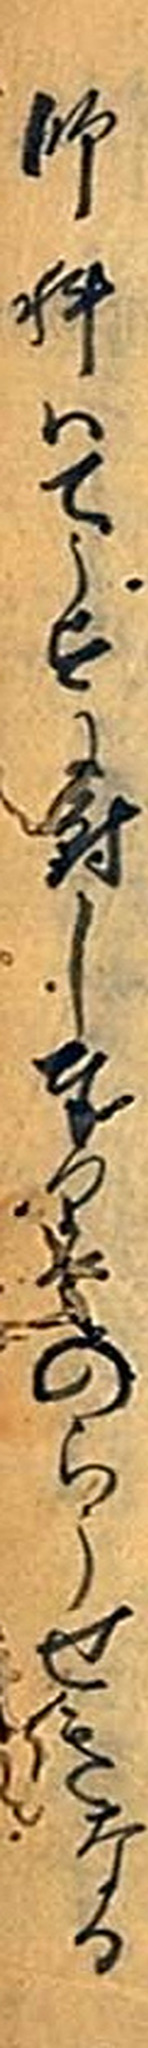師科はてうすに対し奉りてのらうせきなる

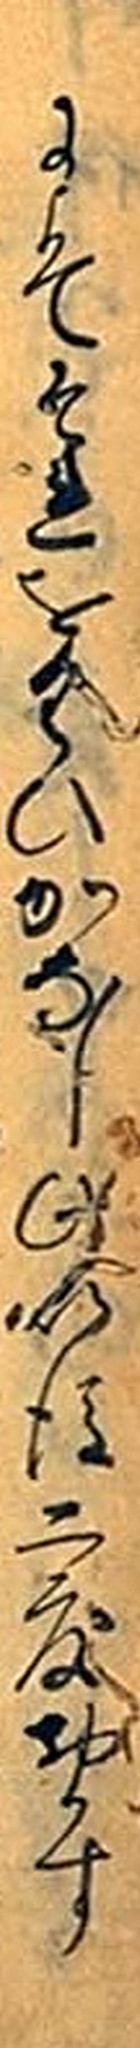によてそれをくひかなしひ以後二度おかす
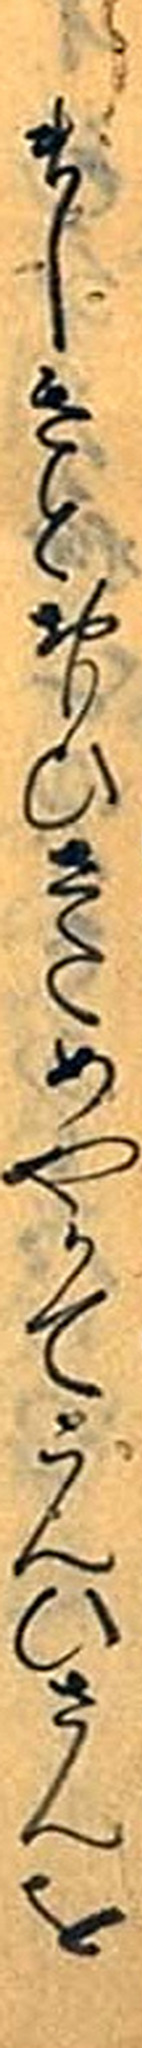ましきとおもひさためやかてこんひさんを
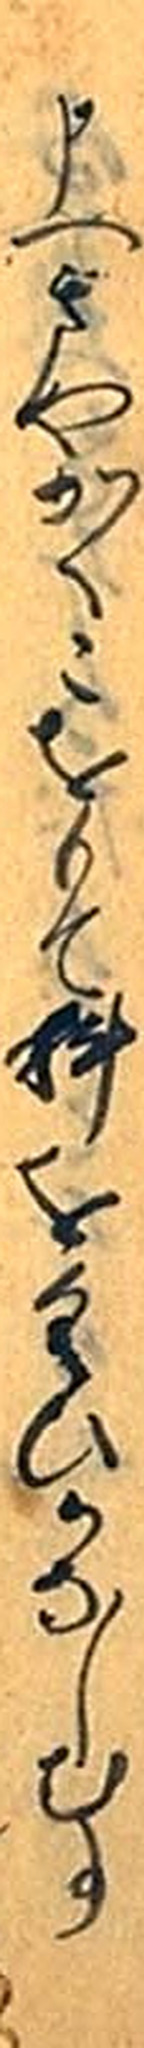申へきやかくこをもて科をくひかなしむ事
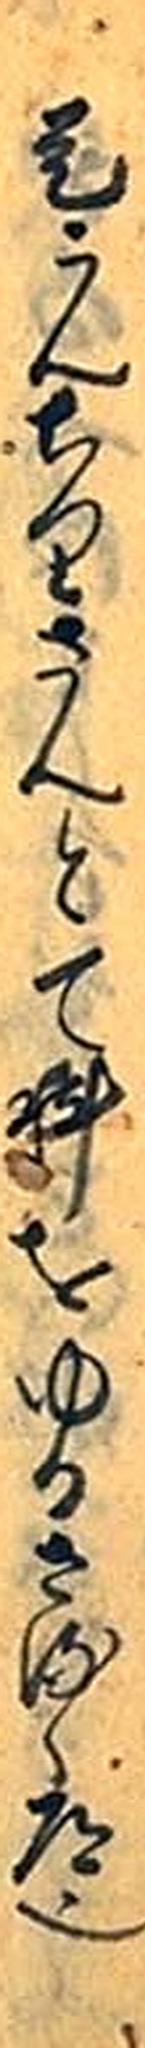是こんちりさんとて科をゆるさるゝ道也
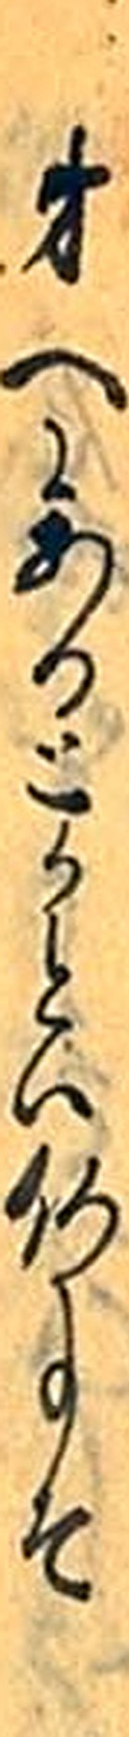弟へにあるとかとは何事そ
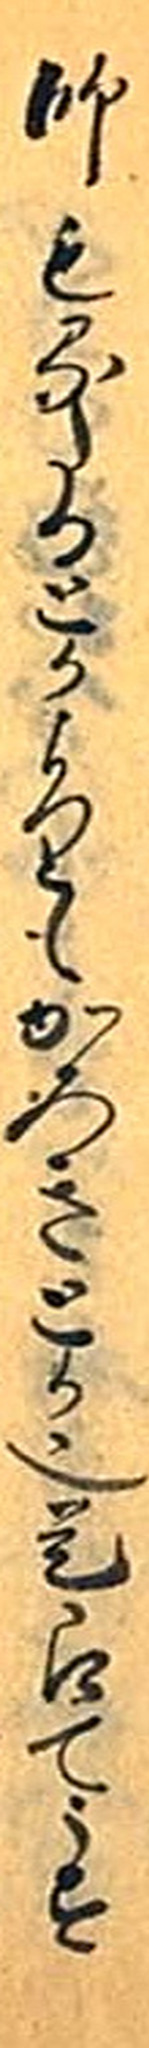師もるたるとかよりもかろきとか也是即てうす
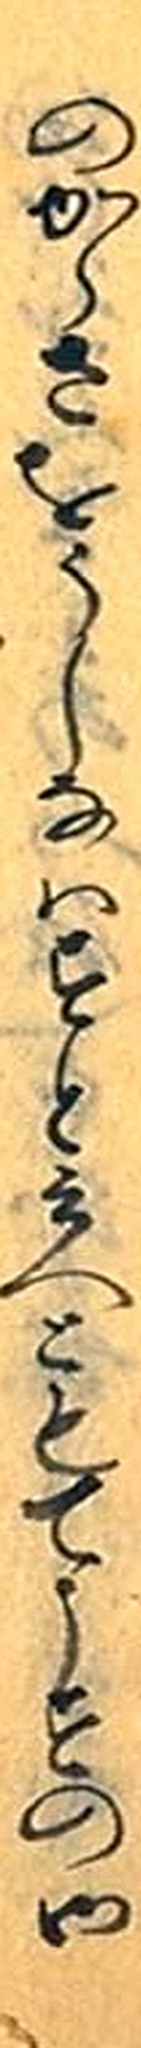のからさをうしなはすと云へともてうすの御
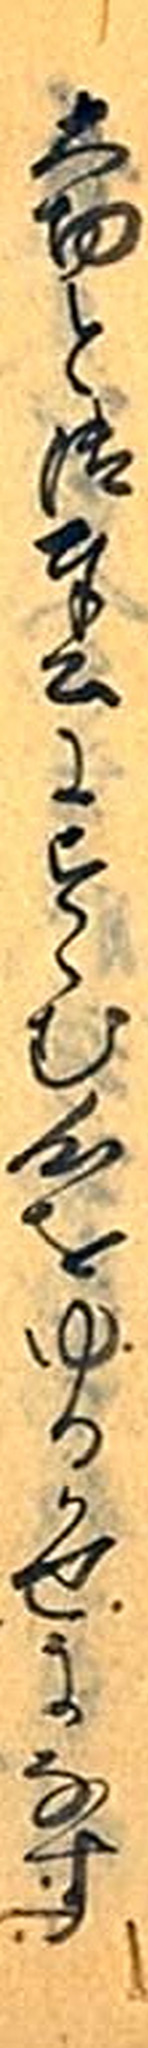大切と御奉公にすゝむ心をゆるかせになす
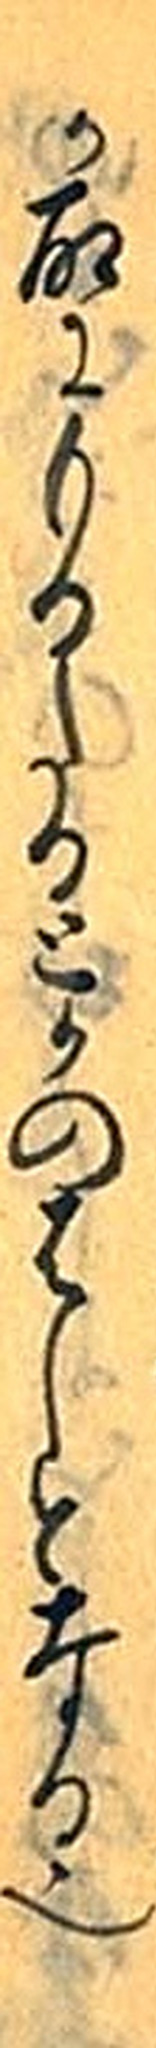か故にもるたるとかのはしとなる也
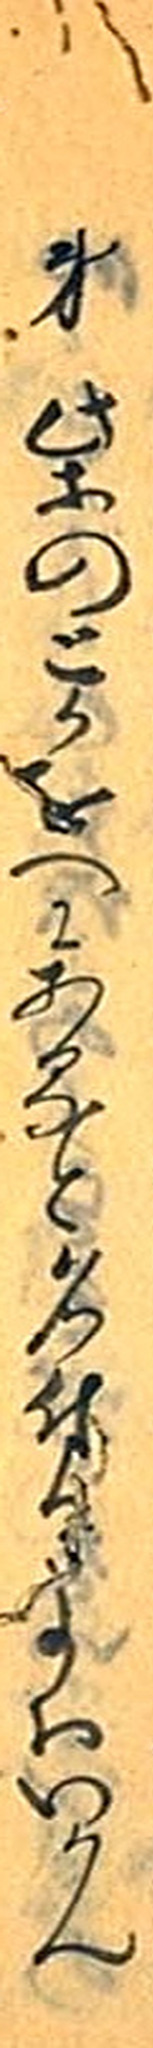弟此等のとかをへにあると名付事はいかん
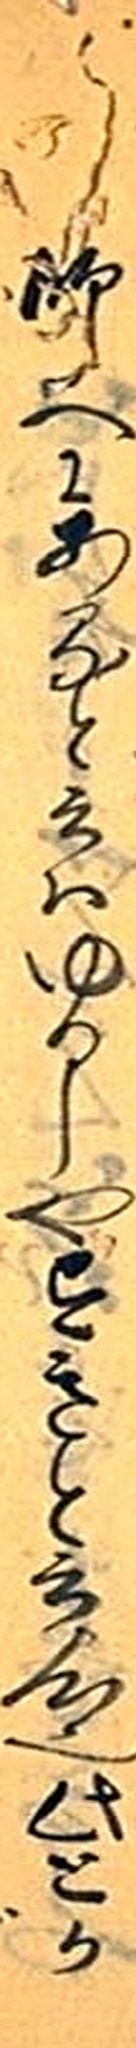師へにあると云はゆるしやすきと云心也此とか
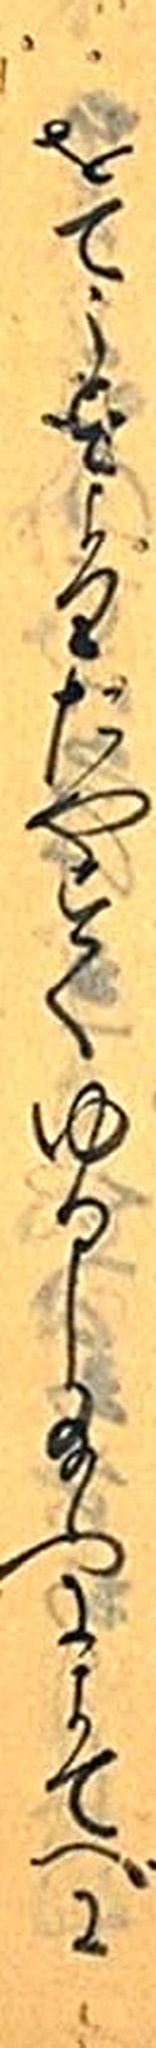をてうすよりたやすくゆるし給ふによてべに
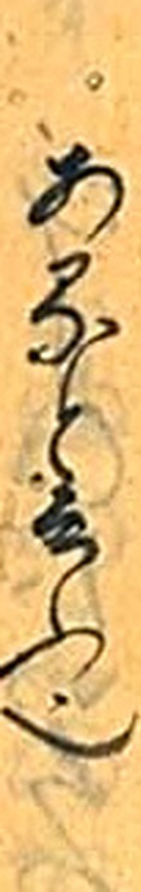あると云ふ也
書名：ドチリナ・キリシタン
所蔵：東京大学総合図書館 / General Library in the University of Tokyo
